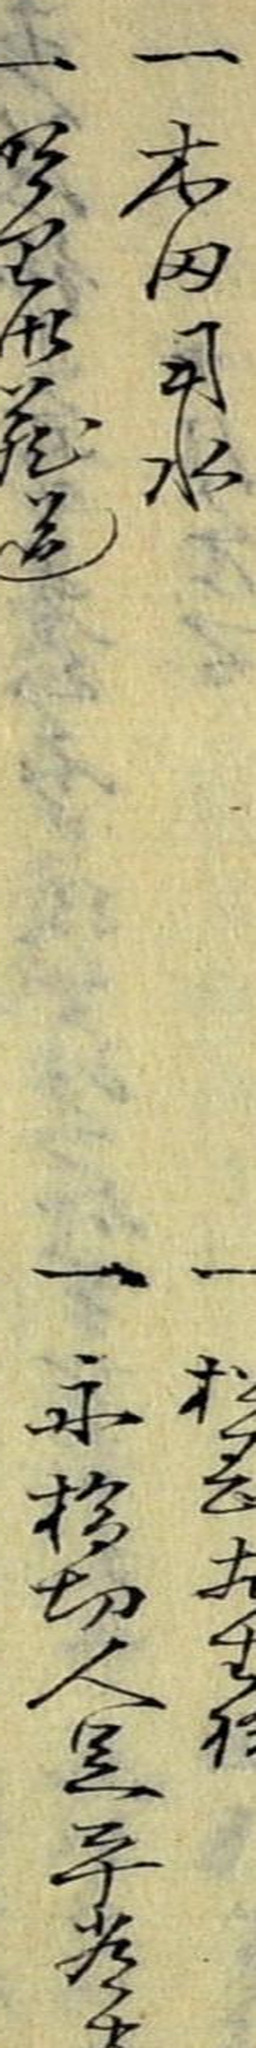一明里御蔵道一永橋切人足平常共
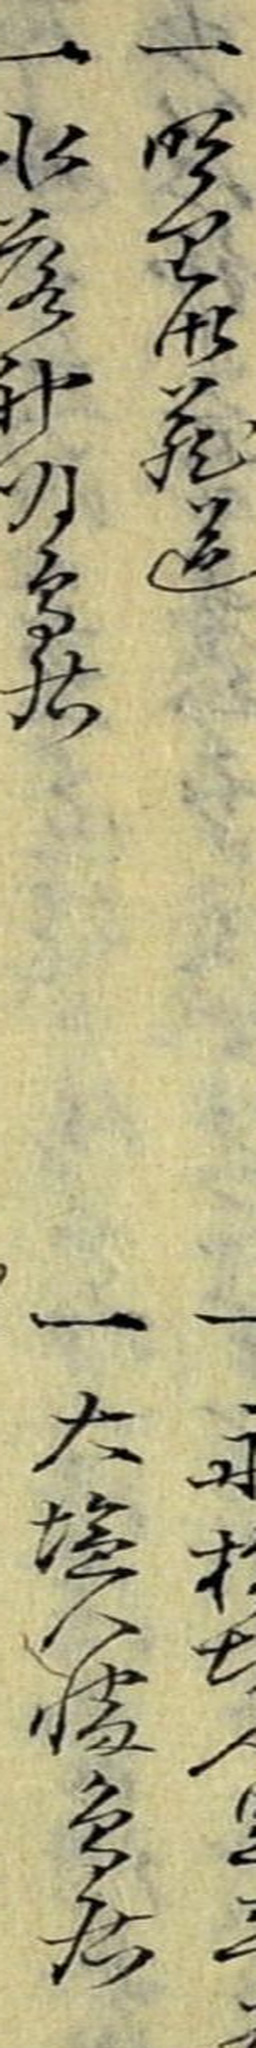一水落神明鳥居一大塩八幡鳥居
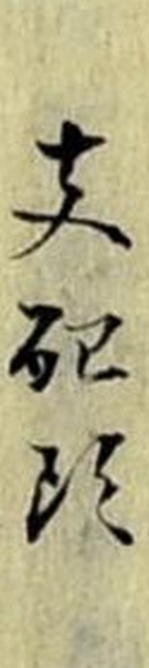支配頭
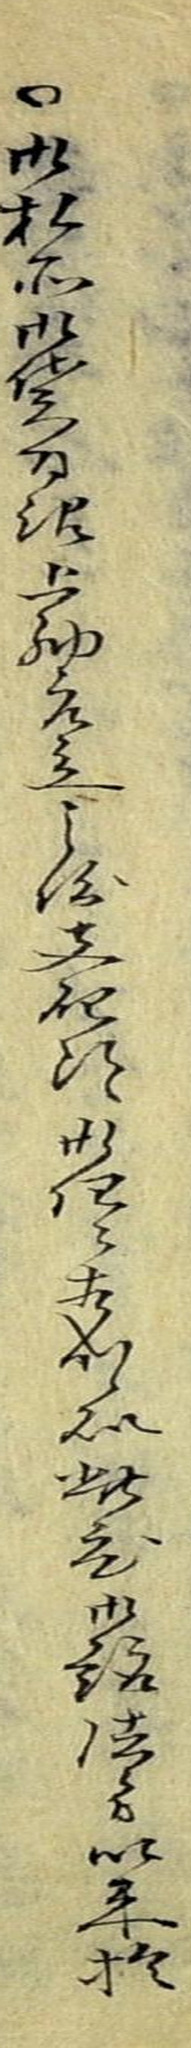○御札所御貸付之儀上納取立之儀支配頭へ御任に相成候処此度御趣法に付以來於
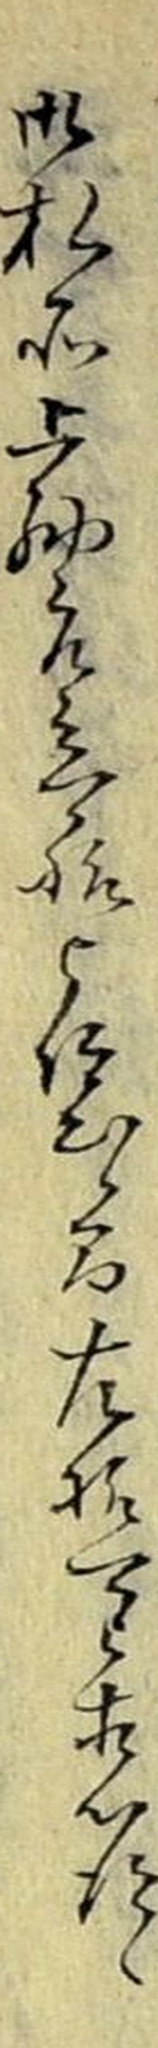御札所上納取立候様被仰出候間左様可被相心得候
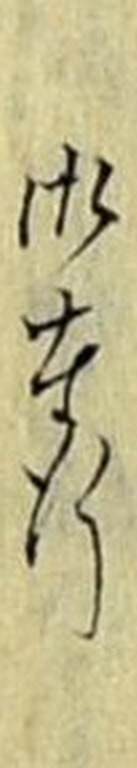御奉行
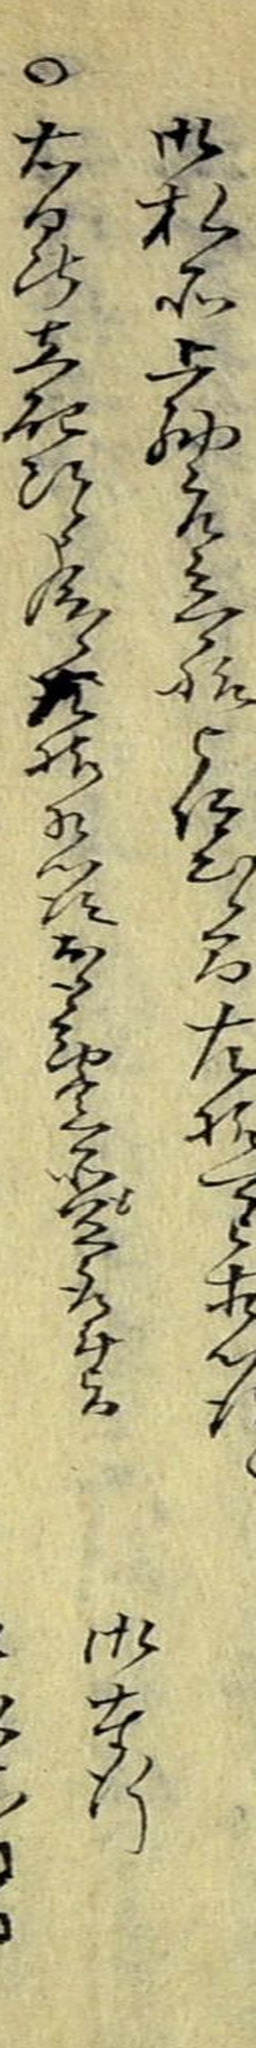○右同断支配頭申渡候左様相心得於御勘定所も宜取斗旨御奉行
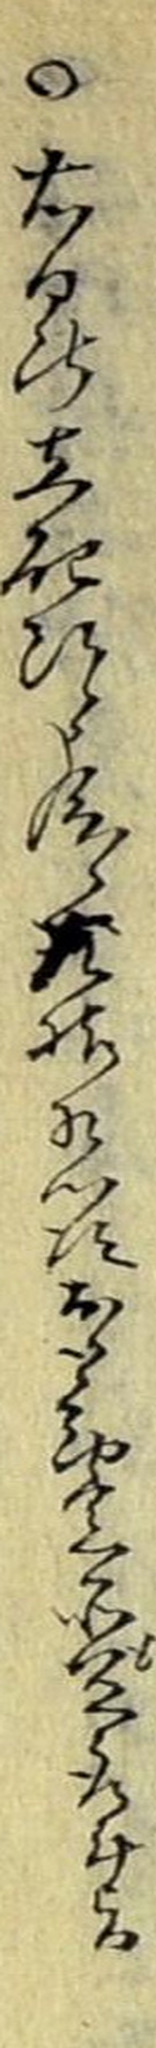○右同断支配頭申渡候左様相心得於御勘定所も宜取斗旨御奉行

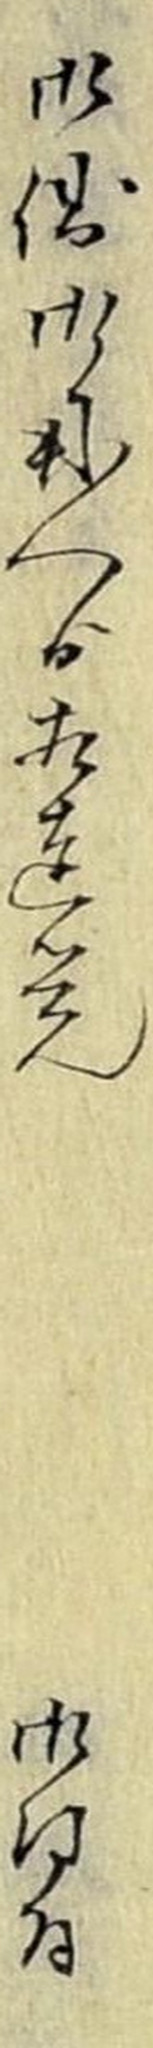御側御用人ゟ相達覚御目付
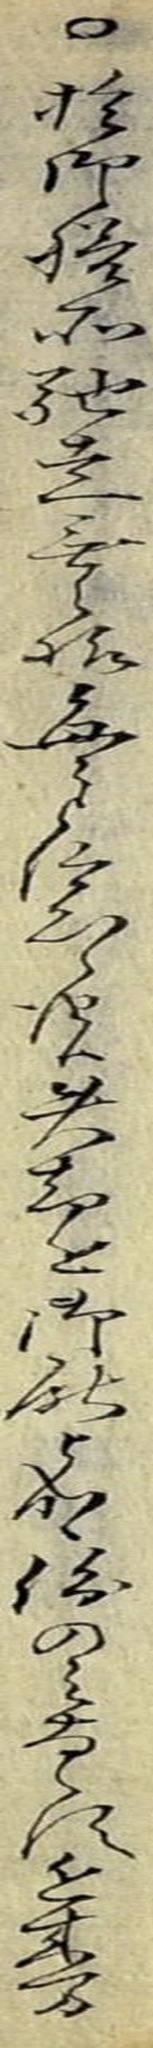○於御膳所馳走無之様毎々被仰出候得は失却と御聴被成候儀のみならす近来万
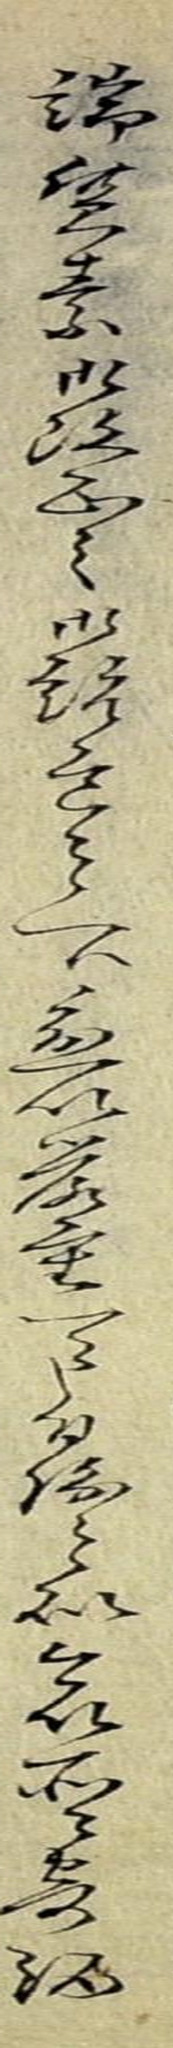端質素御改正之御趣意に候へは愈以厳重可申付儀に候処今以所に寄酒
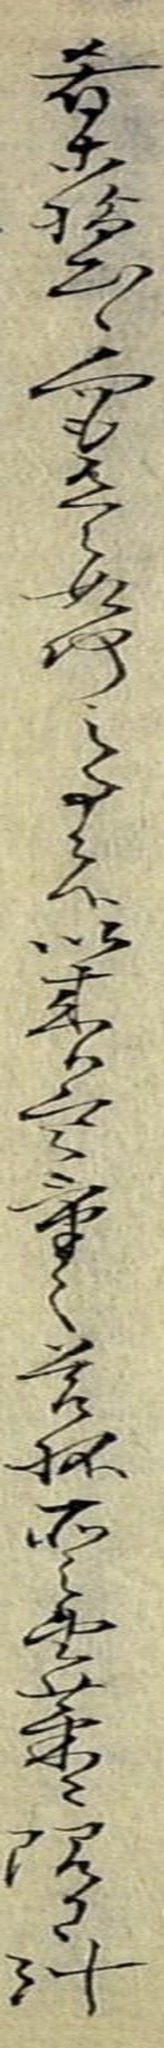肴等指出候向も有之如何之事に候以來は寒気之節抔所之野菜に限り汁
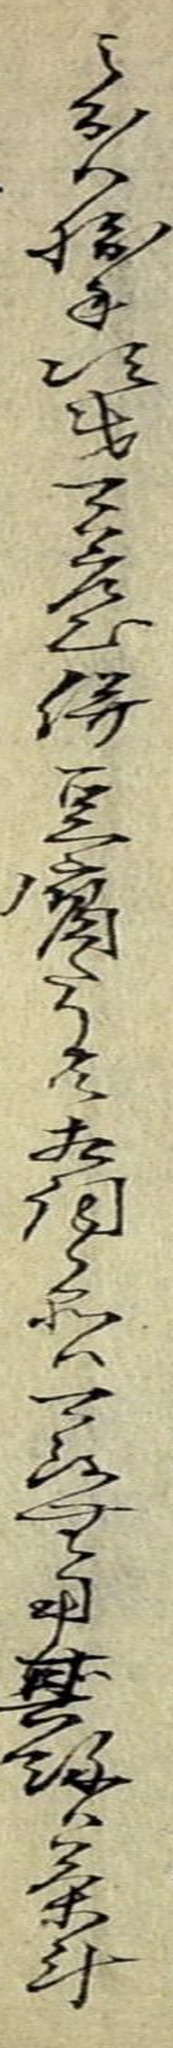之分は勝手次第可差出併豆腐たり共相調候候品は可致無用其餘は茶斗
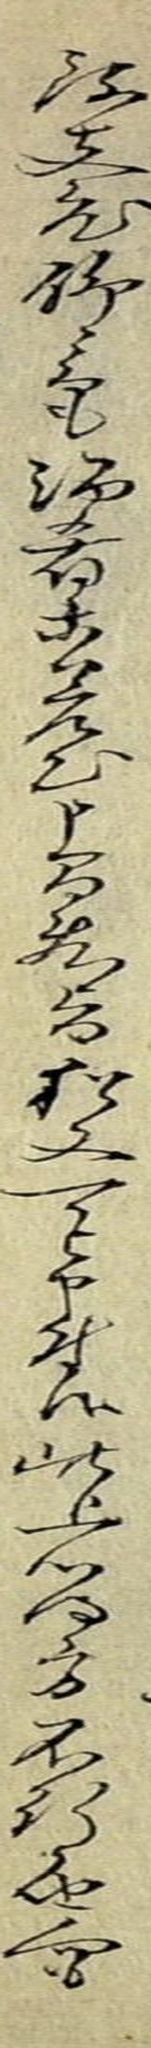致支度聊に而も酒肴等差出申間敷旨猶又可被申付候此上心得方不行届向も
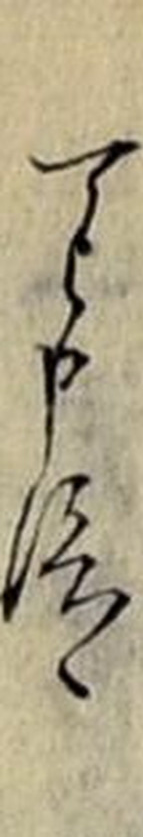可被申渡候
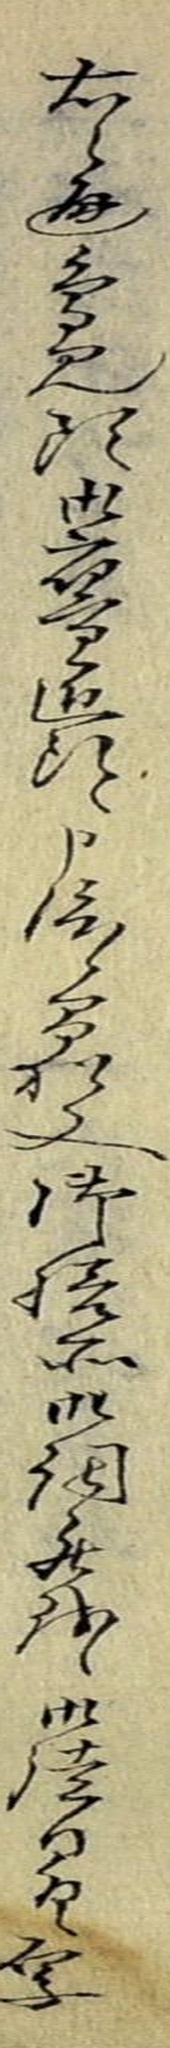右之通鳥見頭御鷹匠頭へ申渡候間猶又御膳所御調罷越候御徒目付厚
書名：命令之部 六
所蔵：福井県文書館 Fukui Prefectural Archives
